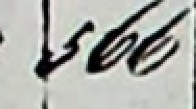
566
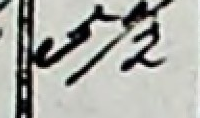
5 1/2
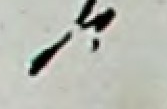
do
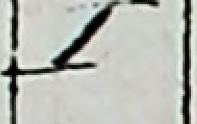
I
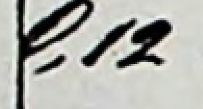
0,12
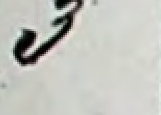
3
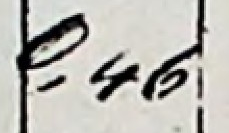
0,46
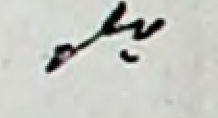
do
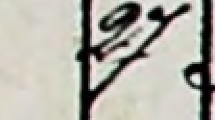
27
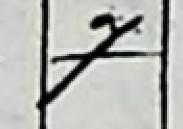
7
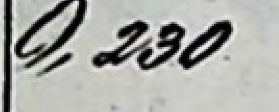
0,230
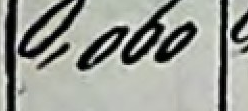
0,060
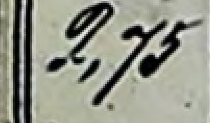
2,75
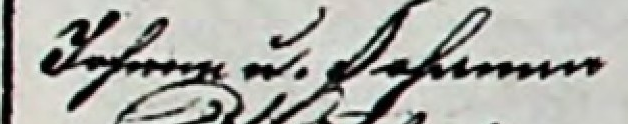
Johann u. Johanna
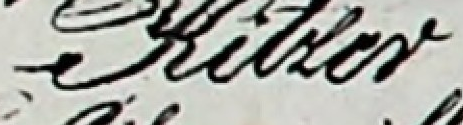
Kitzer
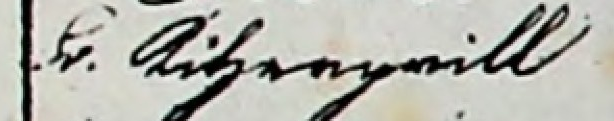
Fr. Kitzengrill
